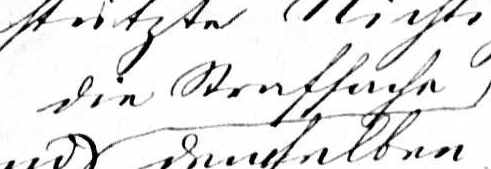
die Strafsache
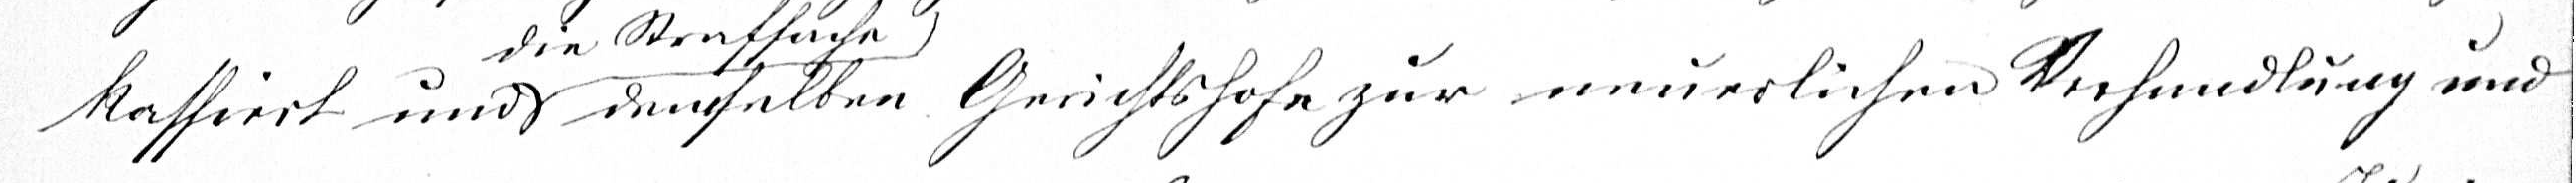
kassiert und denselben Gerichtshofe zur neuerlichen Verhandlung und
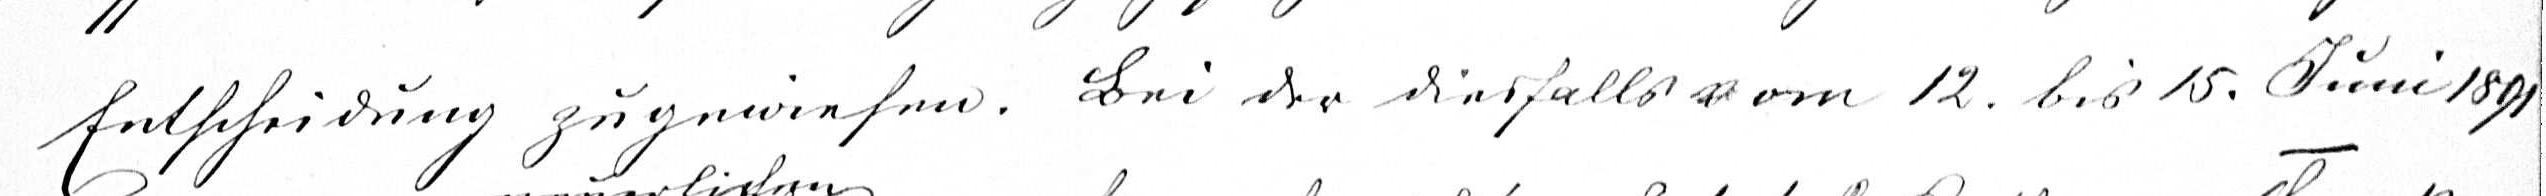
Entscheidung zugewiesen. Bei der diesfalls vom 12. bis 15. Juni 1891
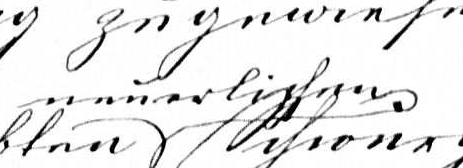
Neuerlichen
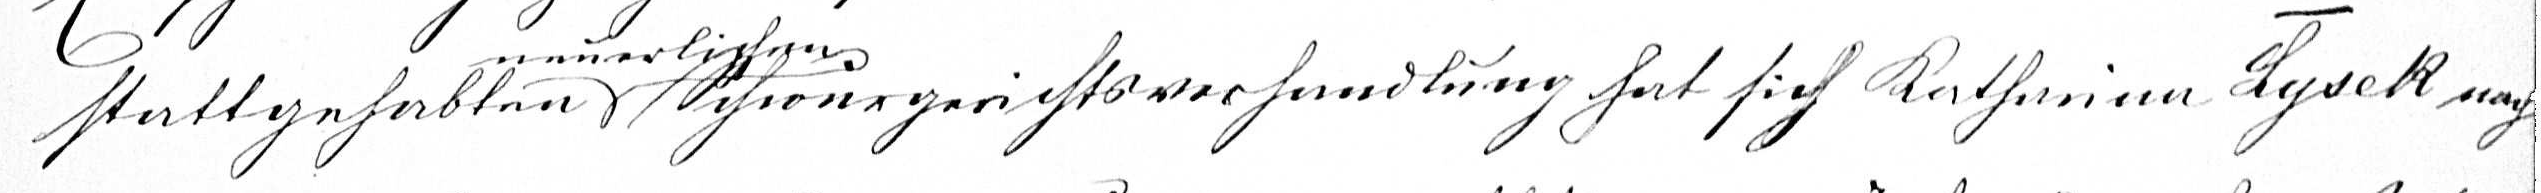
stattgehabten Schwurgerichtsverhandlung hat sich Katharina Lysek nach
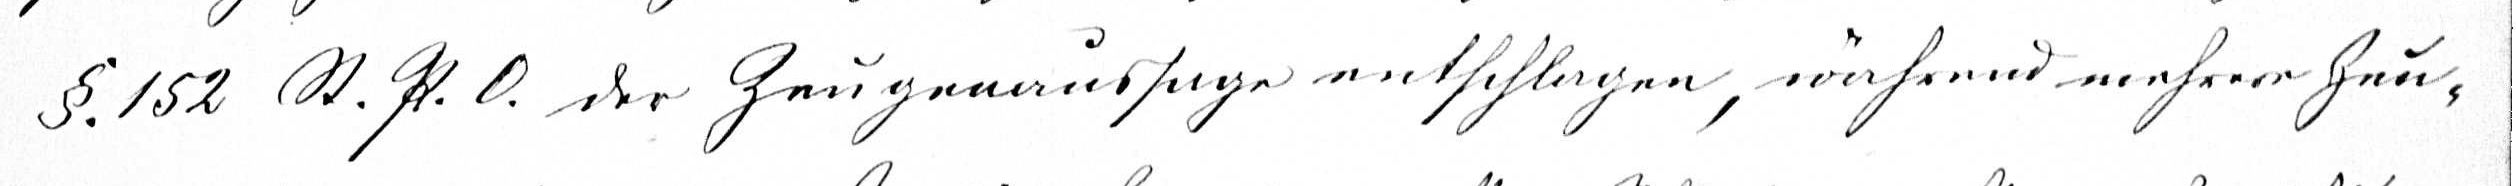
§152 St. P O der Zeugenaussage entschlagen, während mehrere Zeu¬
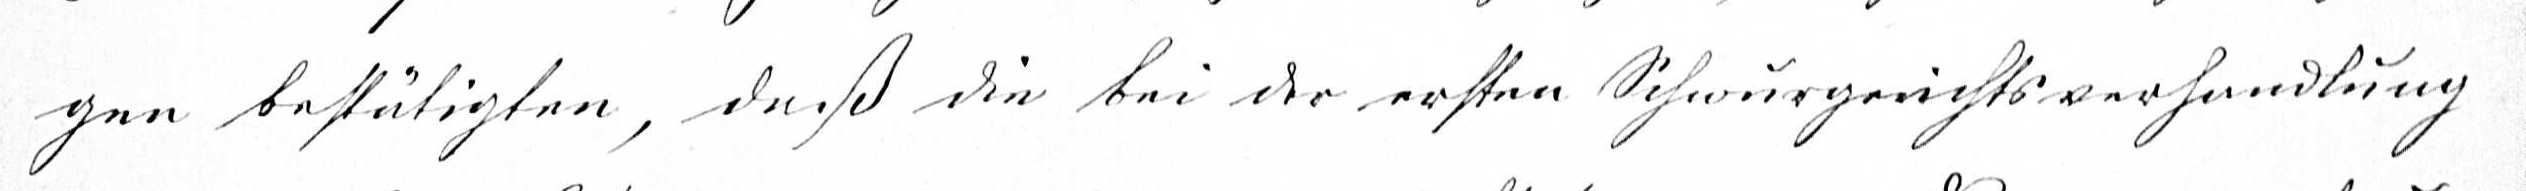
gen bestätigten, daß die bei der ersten Schwurgerichtsverhandlung
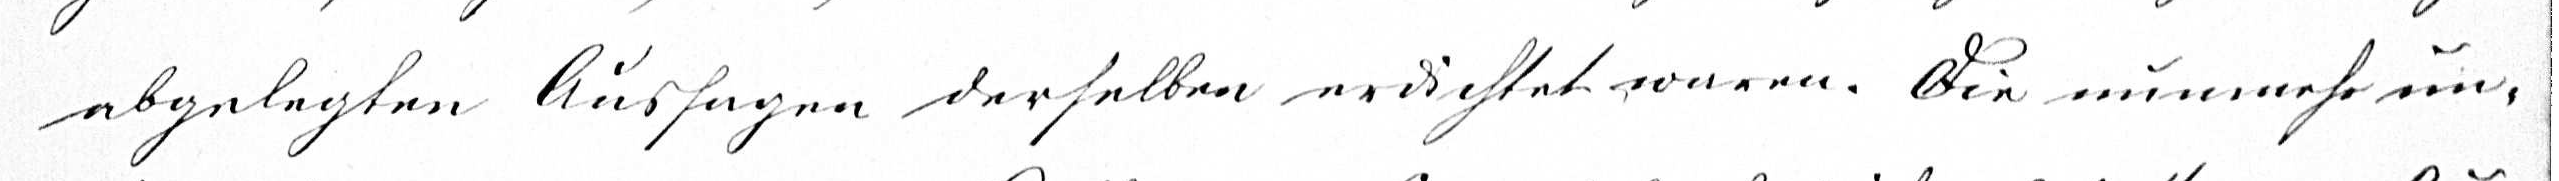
abgelegten Aussagen derselben erdichtet waren. Die nunmehr un¬
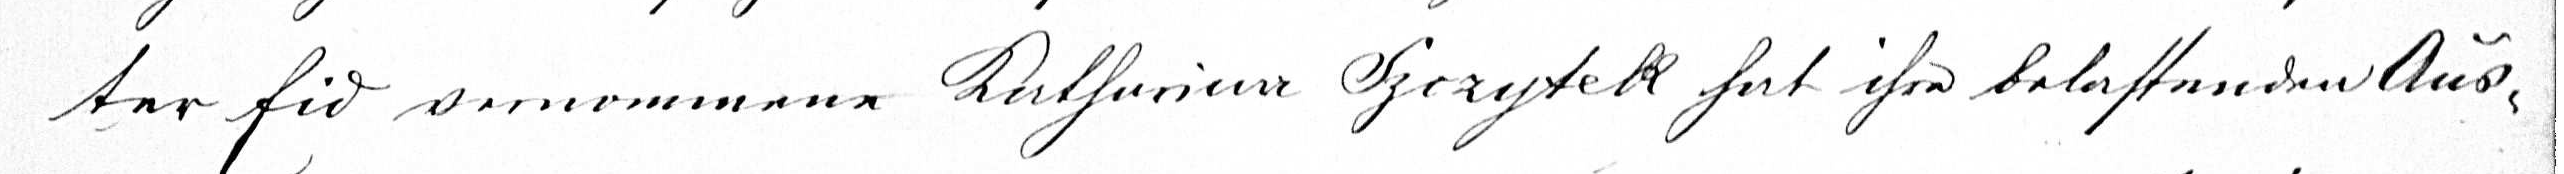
ter Eid vernommenen Katharina Szczytek hat ihr belastenden Aus¬
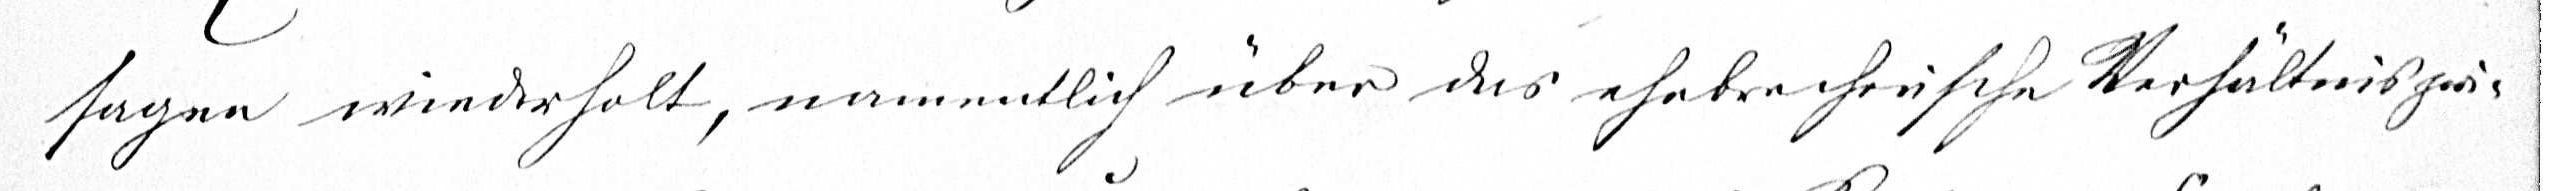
sagen wiederholt, namentlich über das ehebrecherische Verhältnis zwi¬
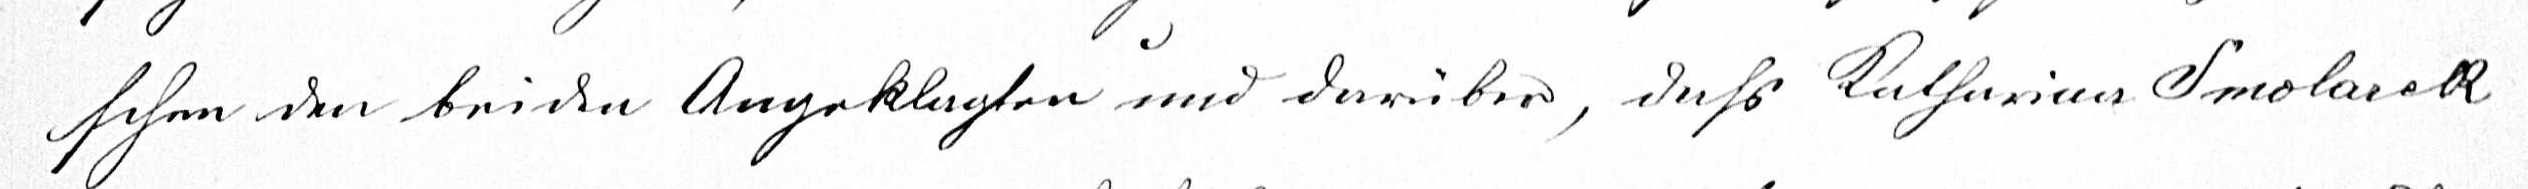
schen den beiden Angeklagten und darüber, daß Katharina Smolarek
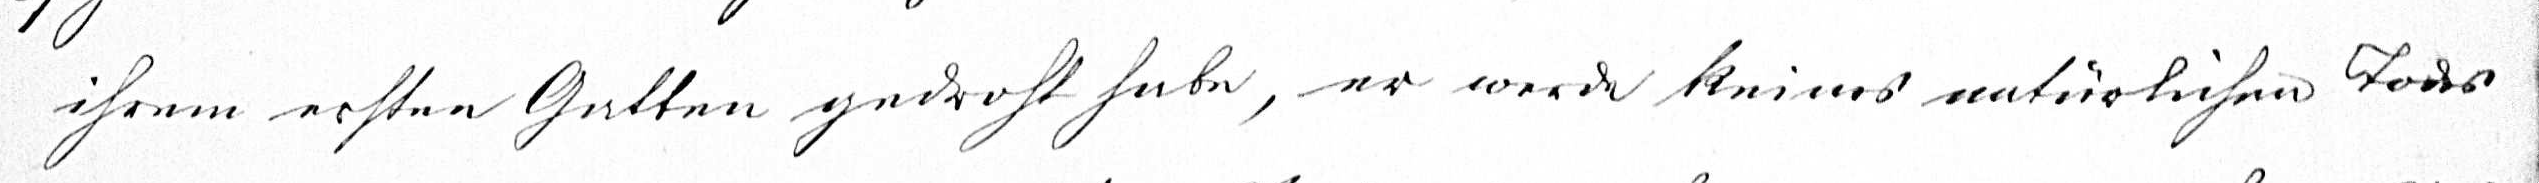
ihrem ersten Gatten gedroht habe, er werde keines natürlichen Todes
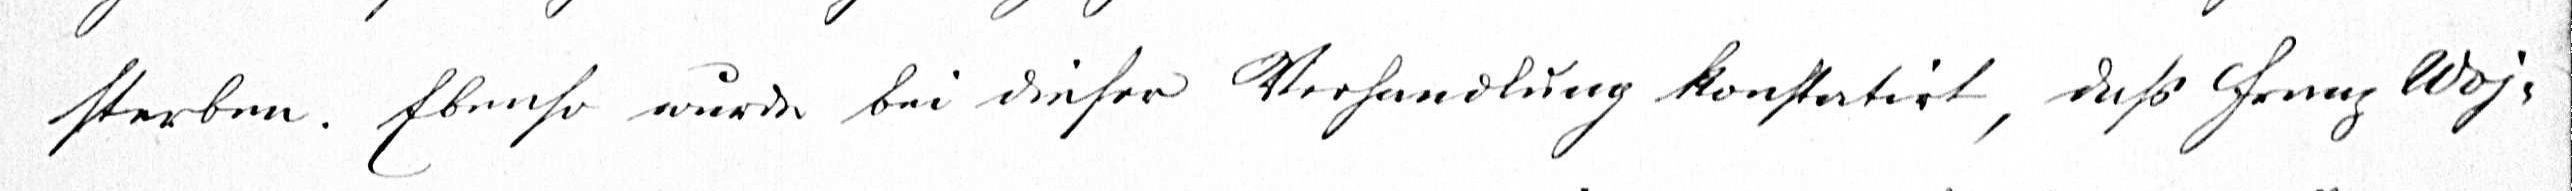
sterben. Ebenso wurde bei dieser Verhandlung konstatirt, daß Farnz Woj¬
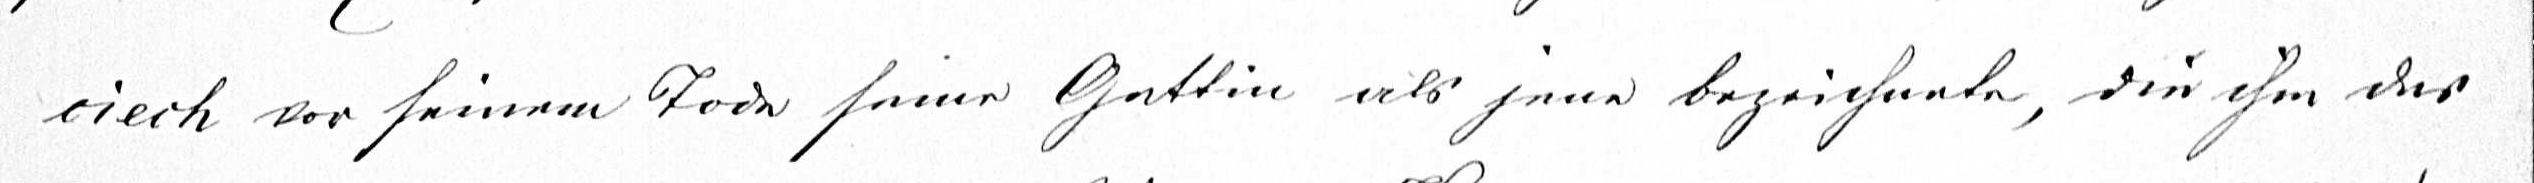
ciech vor seinem Tod seine Gattin als jene bezeichnete, die ihm das
